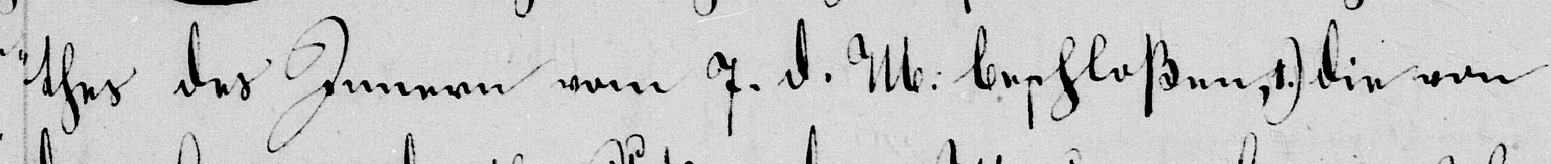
thes des Innern vom 7. d. M. beschloßen, 1.) die von
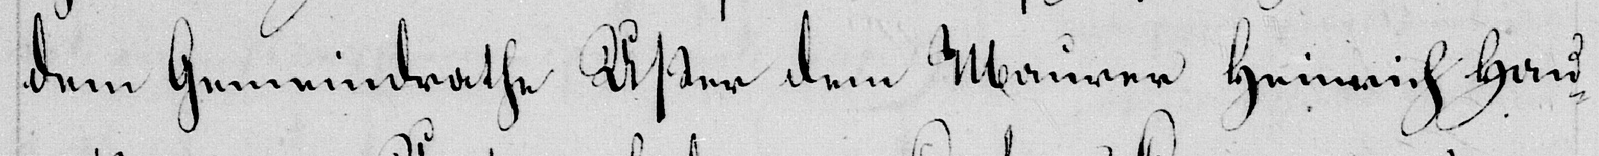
dem Gemeindrathe Uster dem Maurer Heinrich Hau¬
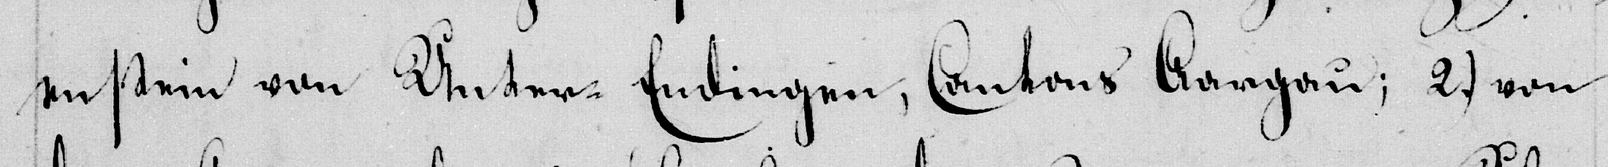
enstein von Unter-Endingen, Cantons Aargau; 2.) von
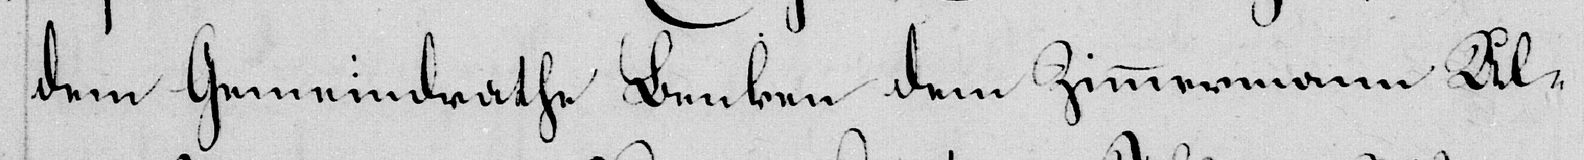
dem Gemeindrathe Benken dem Zimmermann Ul¬
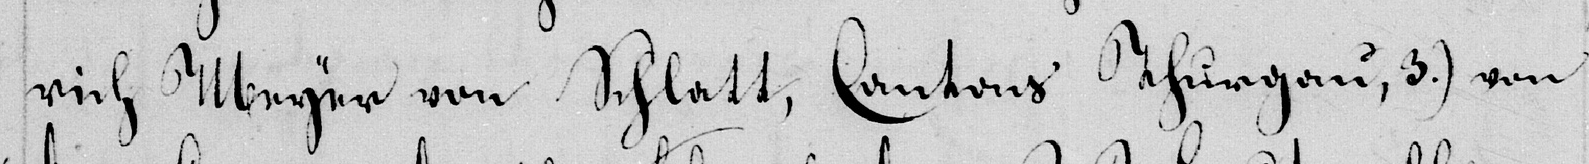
rich Meyer von Schlatt, Cantons Thurgau, 3.) von
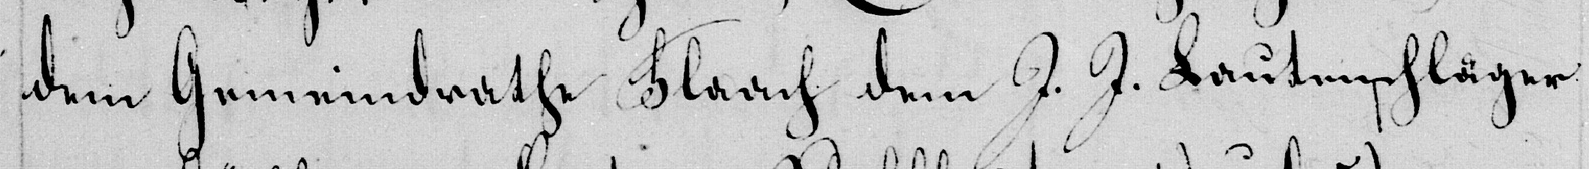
dem Gemeindrathe Flaach dem J. J. Lautenschläger
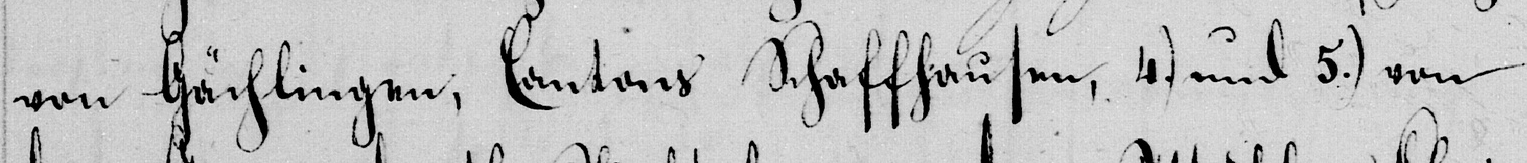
von Gächlingen, Cantons Schaffhausen, 4.) und 5.) von
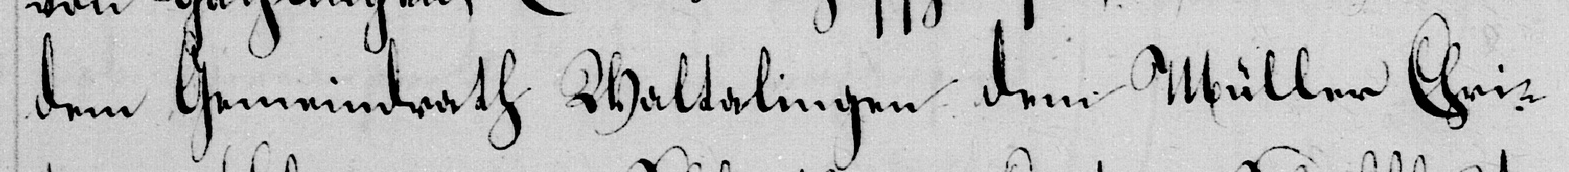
dem Gemeindrath Waltalingen dem Müller Chri¬
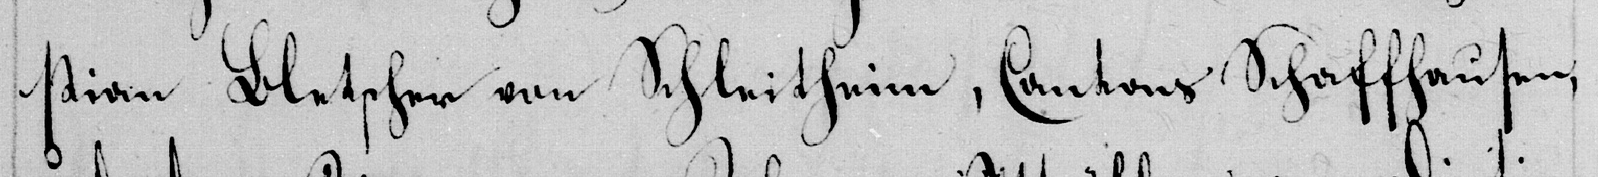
stian Bletscher von Schleithheim, Cantons Schaffhausen,
